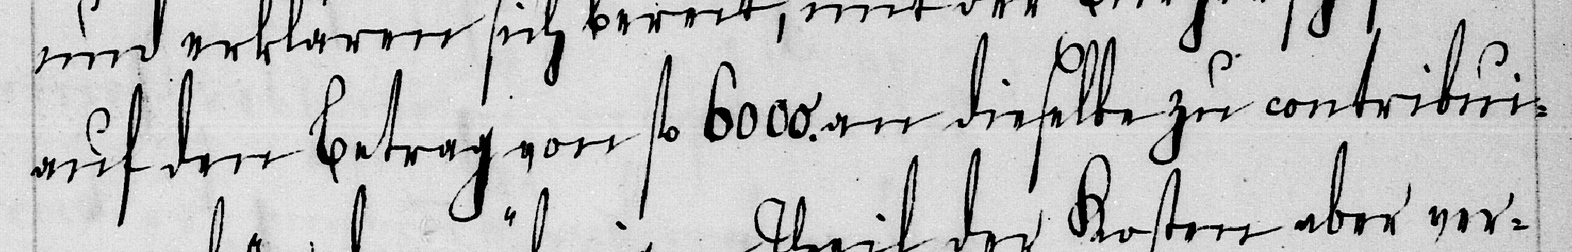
auf den Betrag von fl. 6000 an dieselbe zu contribui¬
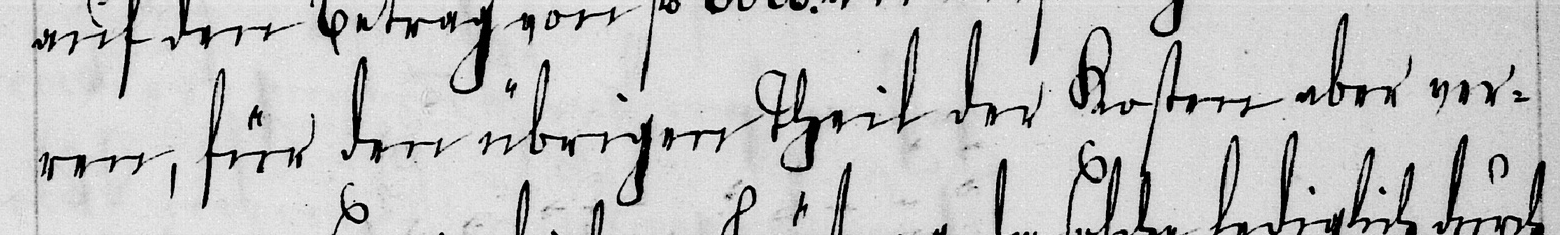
ren, für den übrigen Theil der Kosten aber ver¬
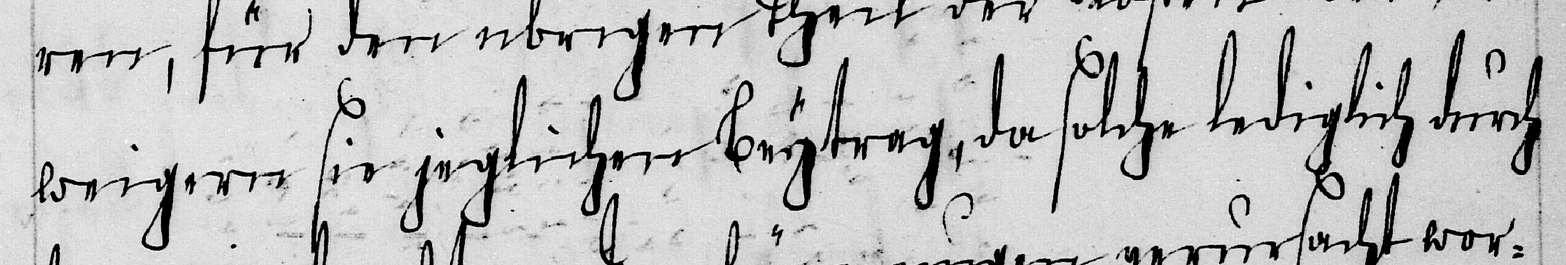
weigern sie jeglichen Beytrag, da solche lediglich
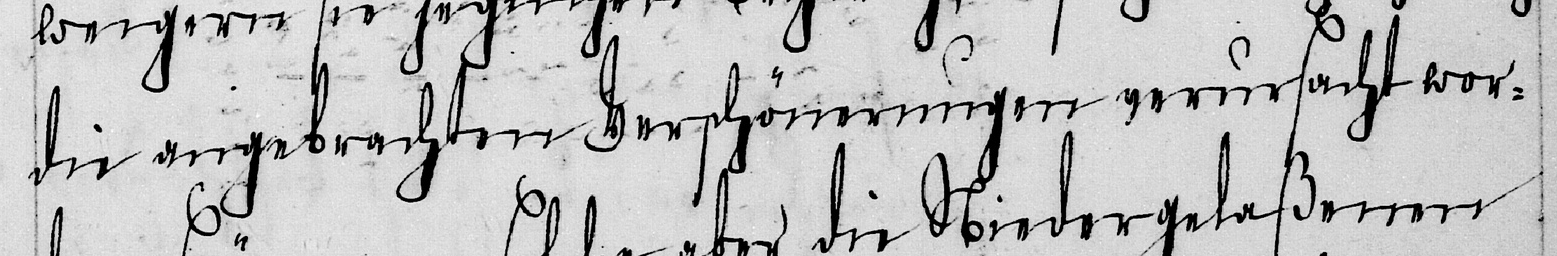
die angebrachten Verschönerungen verursacht wor¬
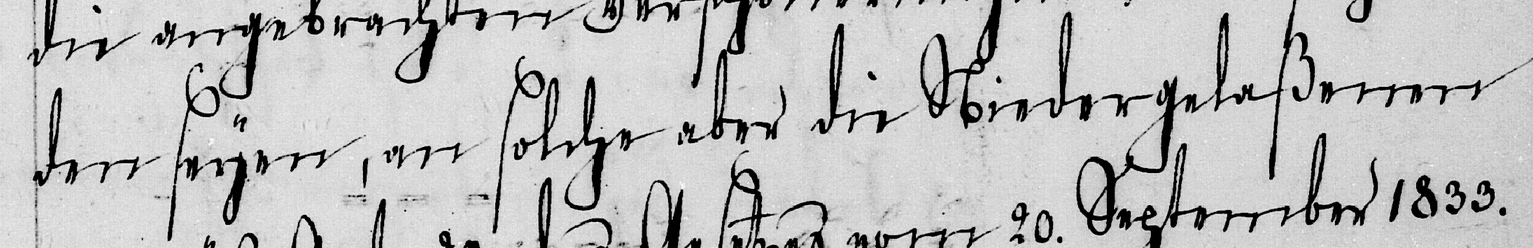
den seyen, an solche aber die Niedergelaßenen
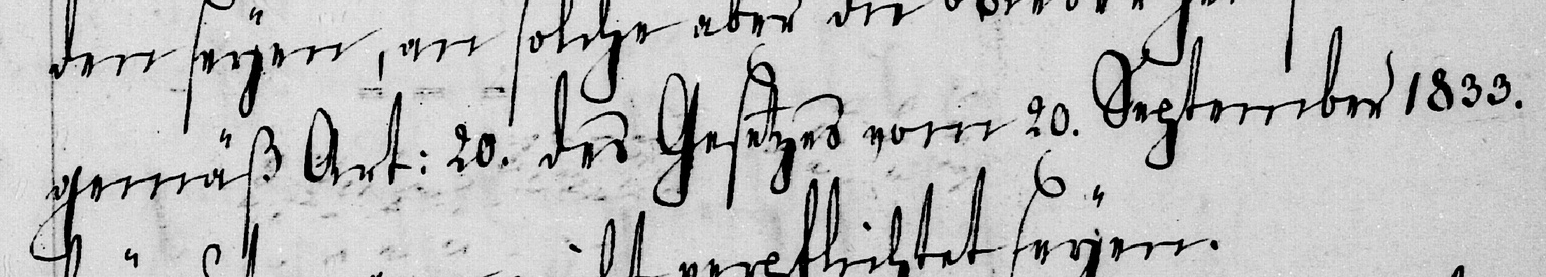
gemäß Art: 20. des Gesetzes vom 20. September 1833.
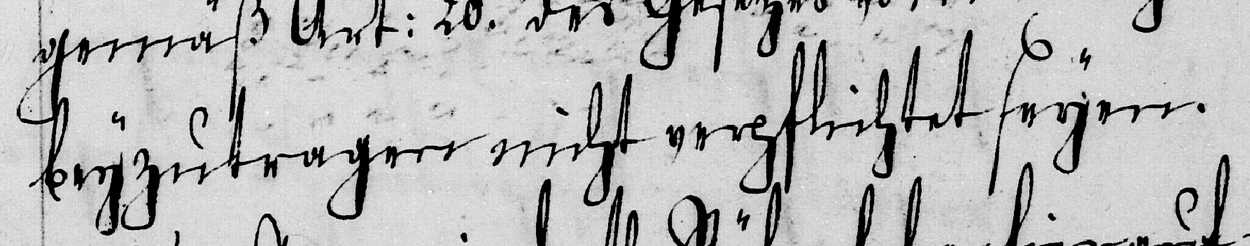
beyzutragen nicht verpflichtet seyen.
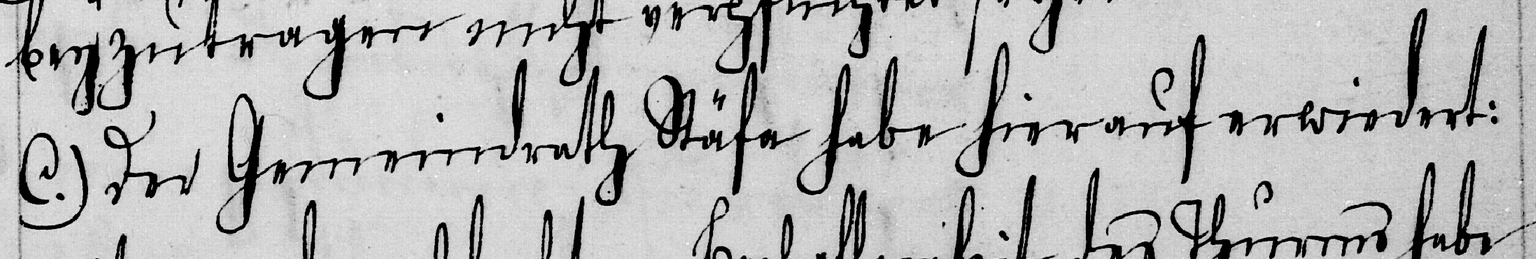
C.) Der Gemeinderath Stäfa habe hierauf erwiedert:
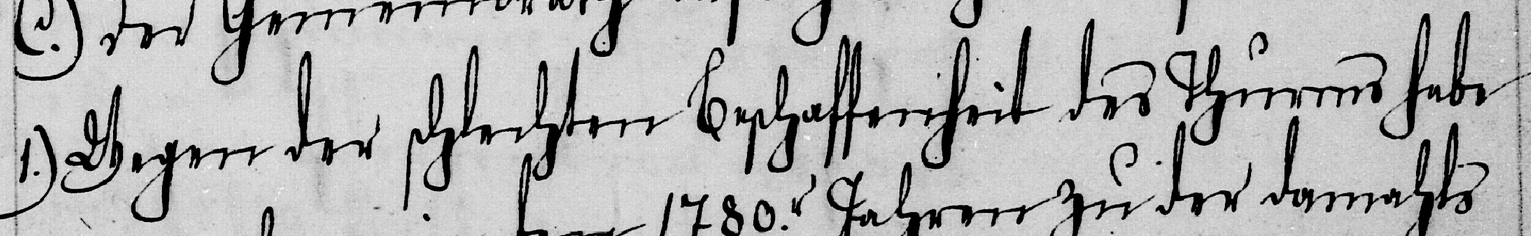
1.) Wegen der schlechten Beschaffenheit des Thurms habe
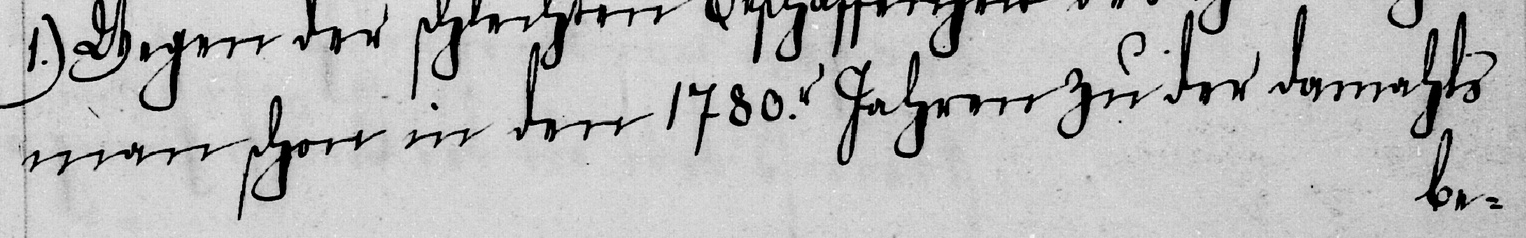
man schon in den 1780.er Jahren zu der damahls
